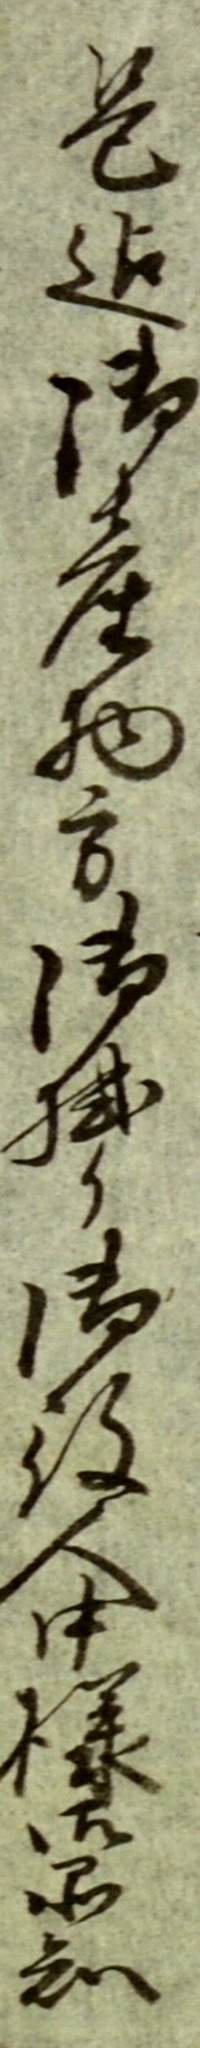是迄御産物方御掛り御役人中様御承知
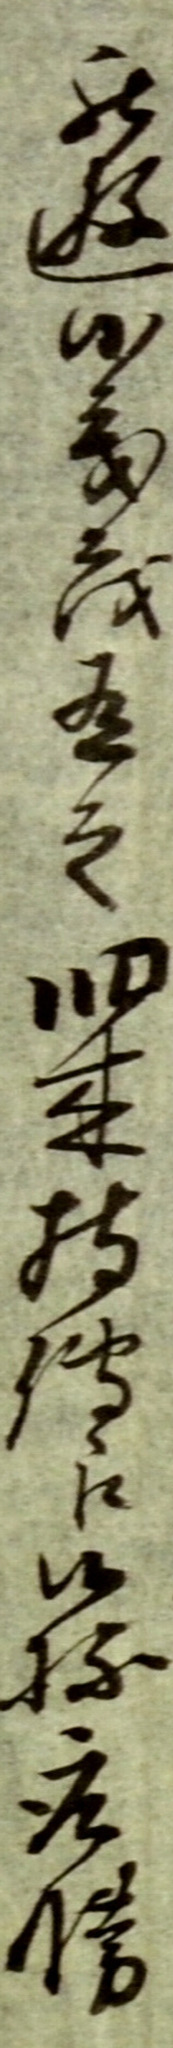被遊候義茂有之哉来持伝江候抔取飾
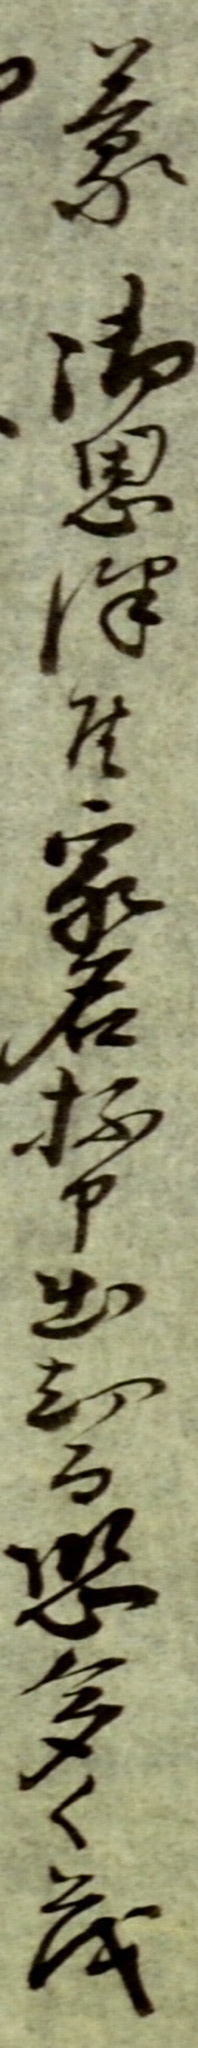蒙御恩沢候家名抔申出却而恐多く茂
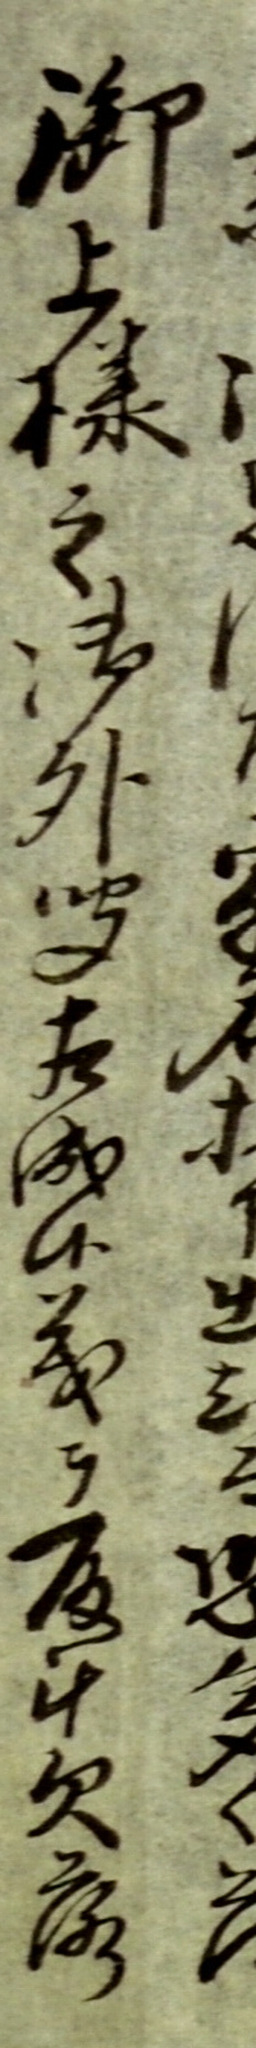御上様之御外聞相成候義ヲ取計欠落
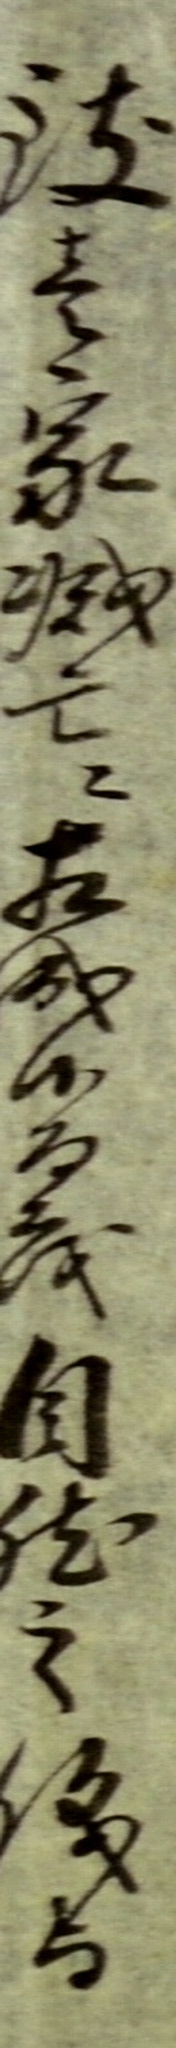致壱家滅亡ニ相成候而茂自然之儀と

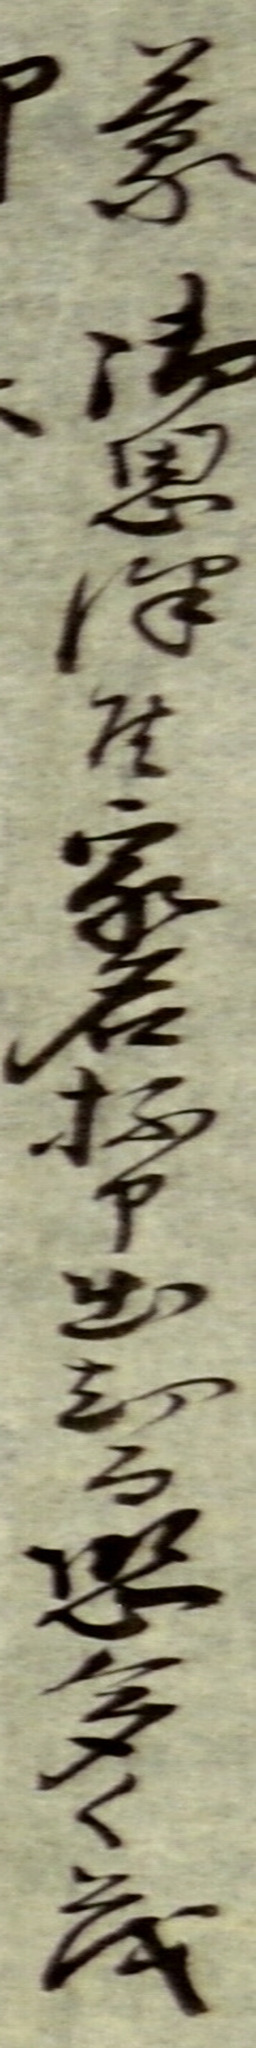蒙御恩沢候家名抔申出却而恐多く茂
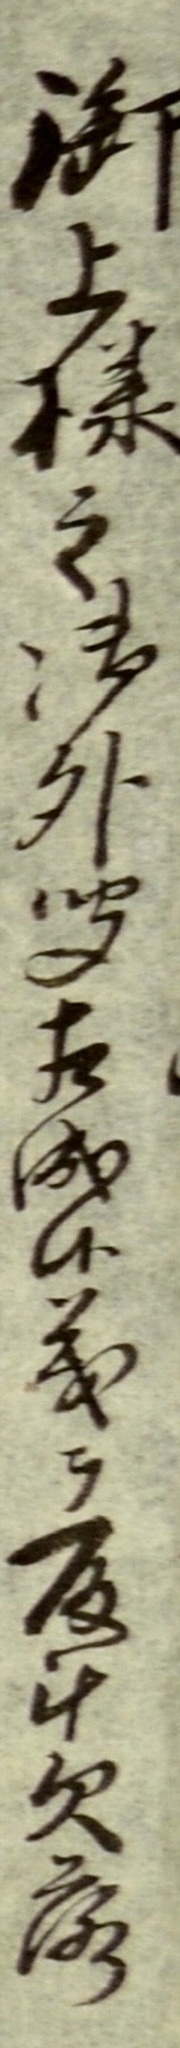御上様之御外聞相成候義ヲ取計欠落
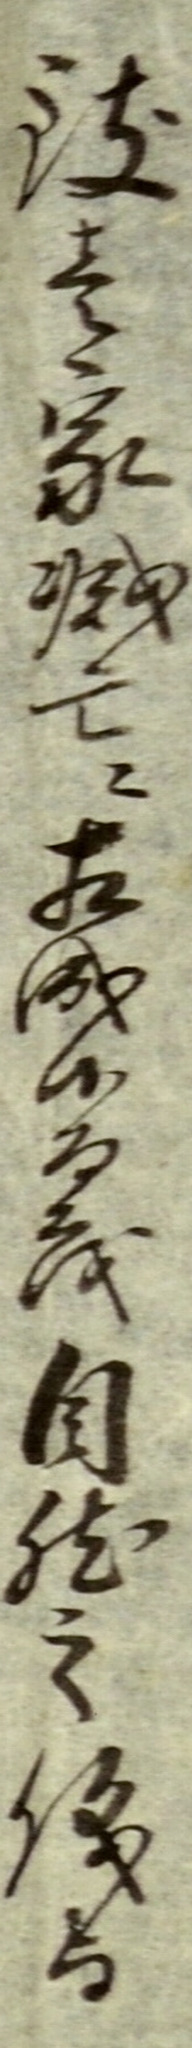致壱家滅亡ニ相成候而茂自然之儀と
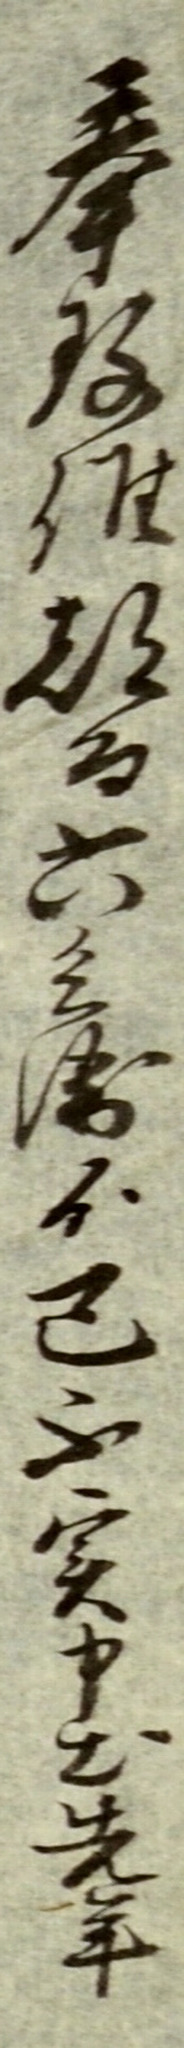奉存候都而六兵衛ゟ己不実申出先年
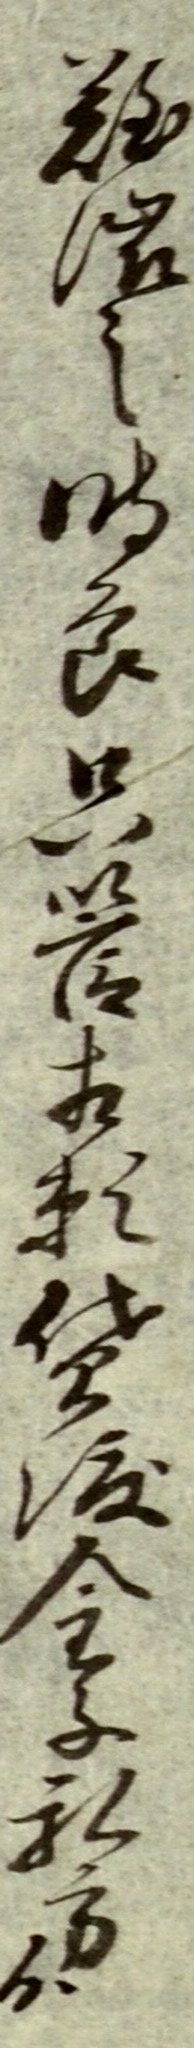難渋之時節只管相願貸渡金子私方ゟ
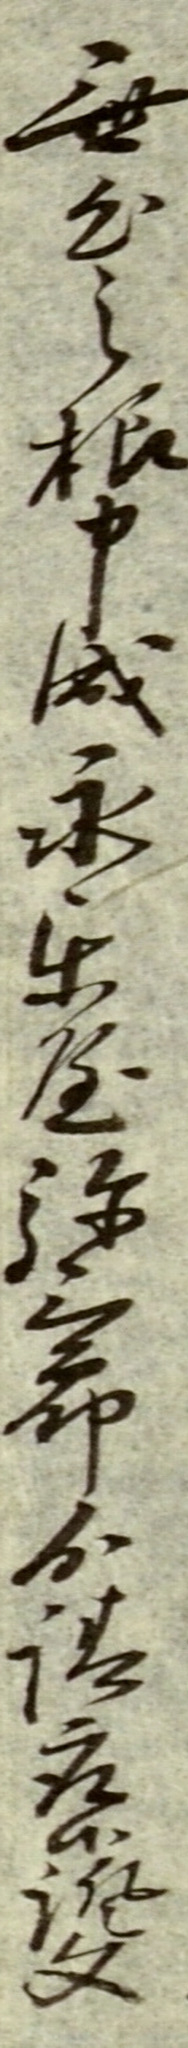無心之様申成永楽屋弥三郎ゟ請取候証文
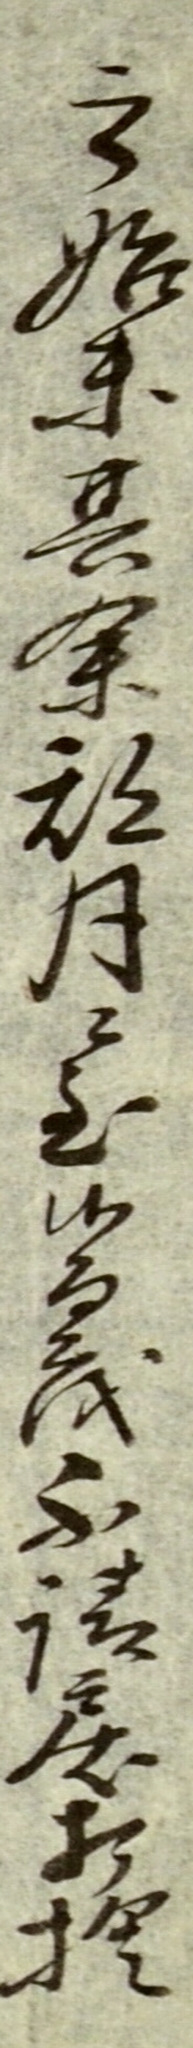之始末其余期月至候而茂不請戻打捨
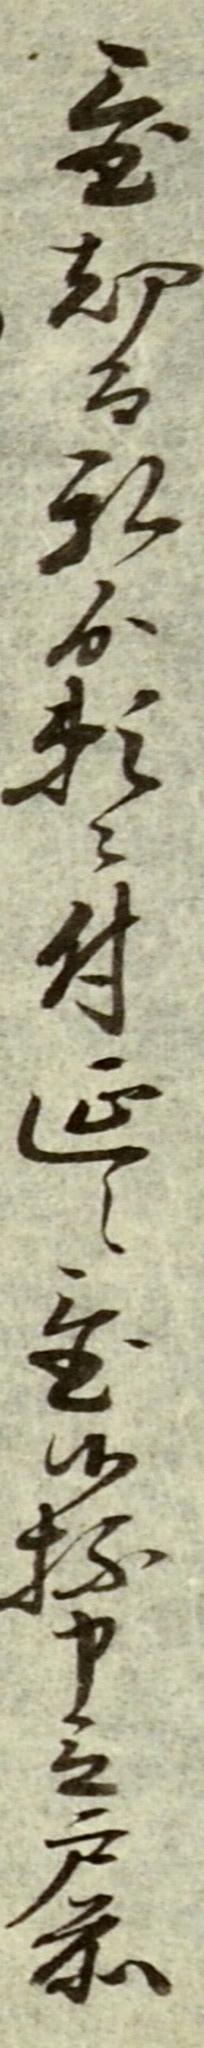置却而私ゟ願ニ付延し置候抔申立て戸前
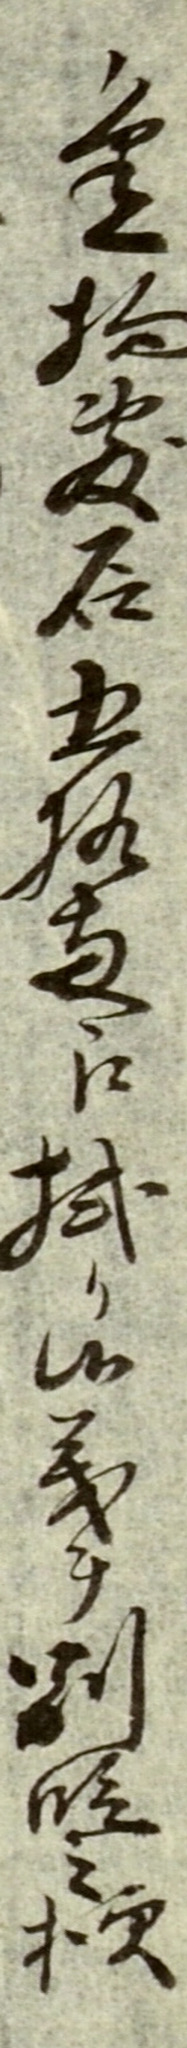金物敷名五拾両江掛り候義ヲ別段之様
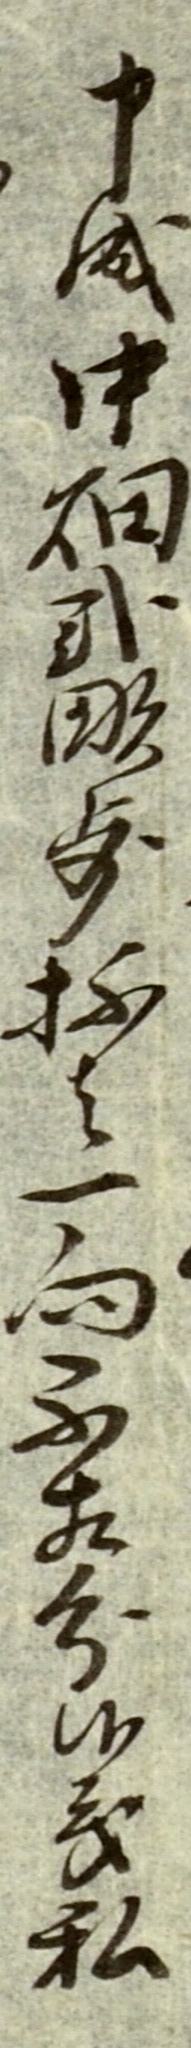申成中畑弐畝歩抔者一向不相分候義私
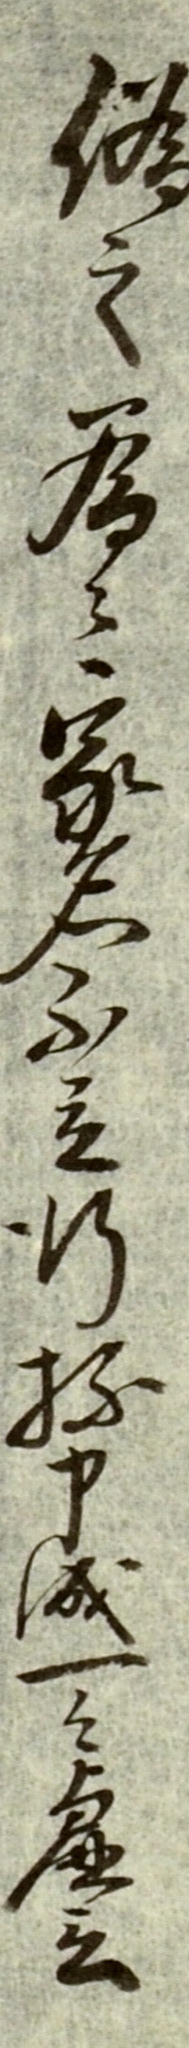偽之為ニ家名不立行抔申成一々虚言
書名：乍恐以口上書奉申上候御事
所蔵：伊那市立高遠町図書館・合同会社AMANE
